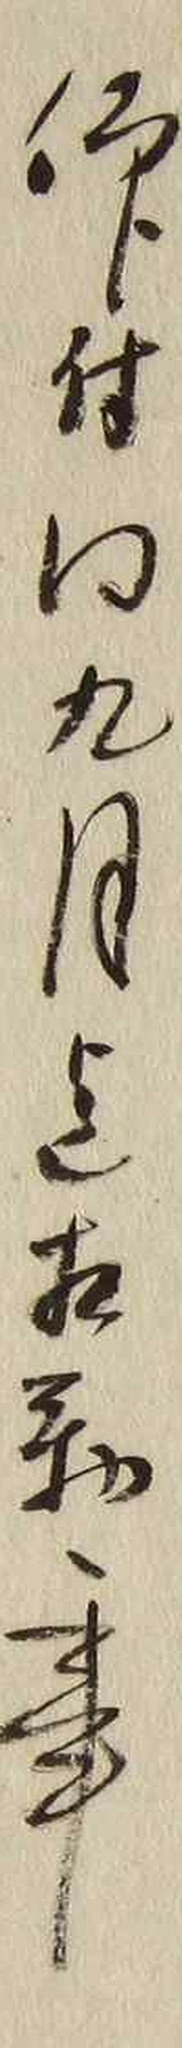仰付同九月迄相勤候事
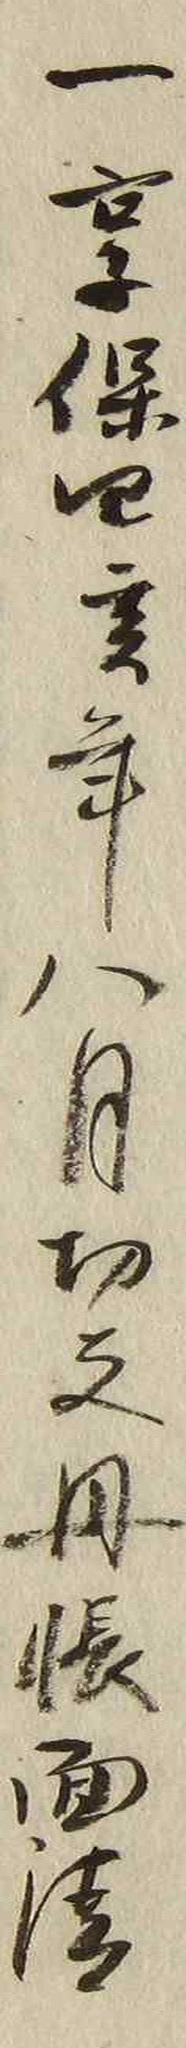一享保四亥年八月切支丹帳面清
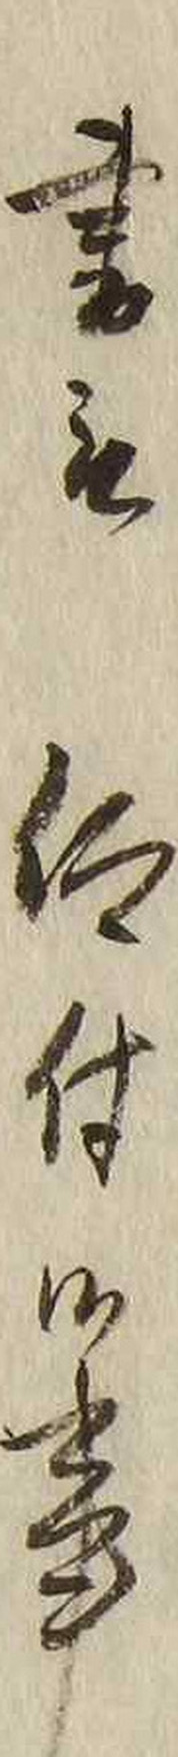書被仰付候事
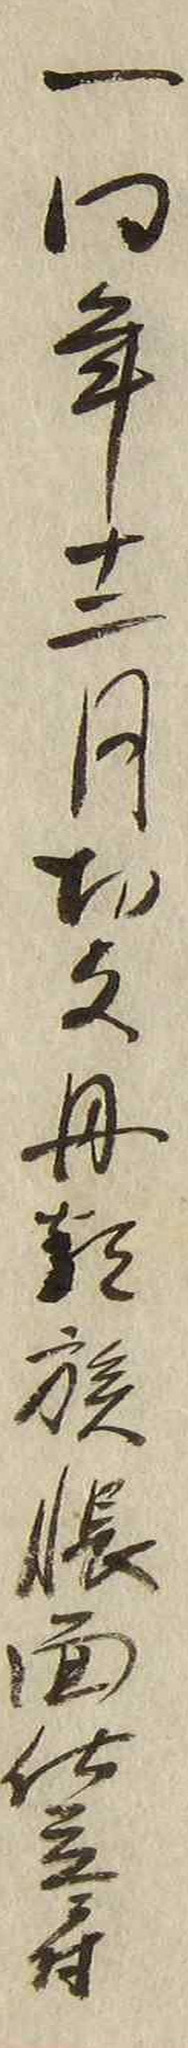一同年十二月切支丹類族帳面仕立に付

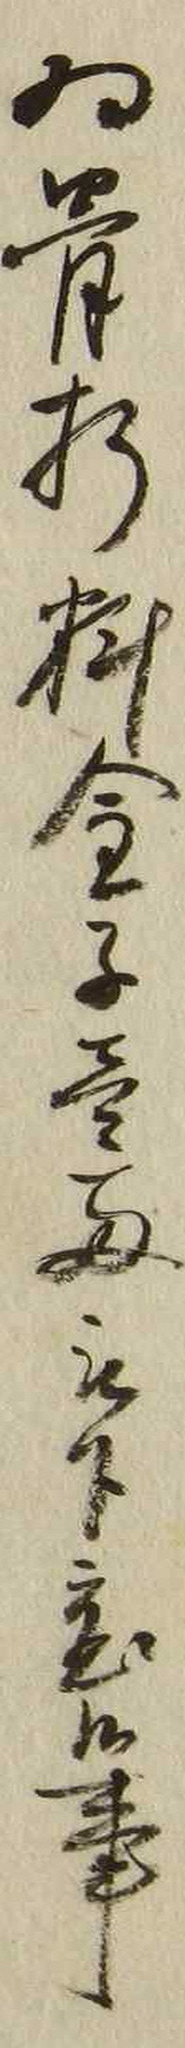為骨折料金子壱両被下置候事
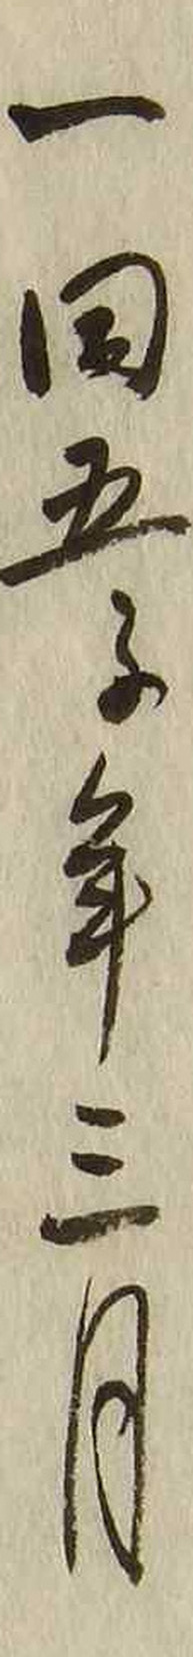一同五子年三月
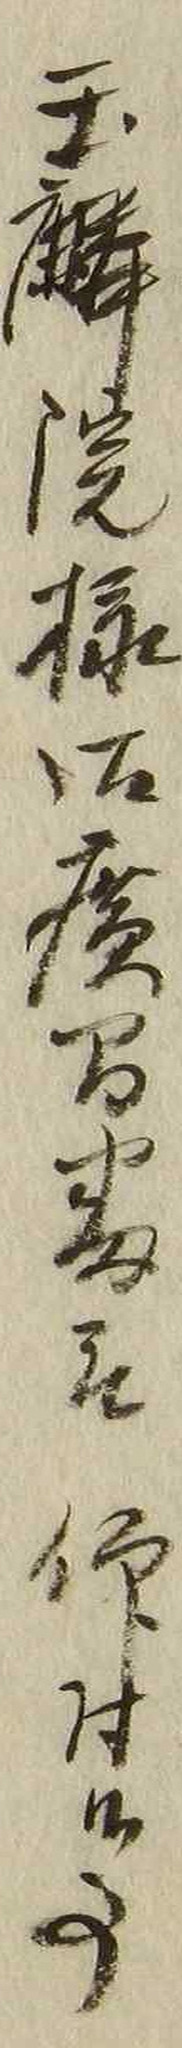玉麟院様御広間番被仰付候事
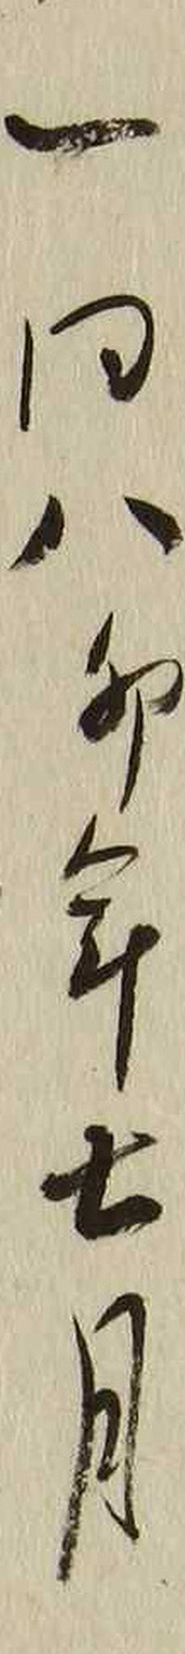一同八卯年七月
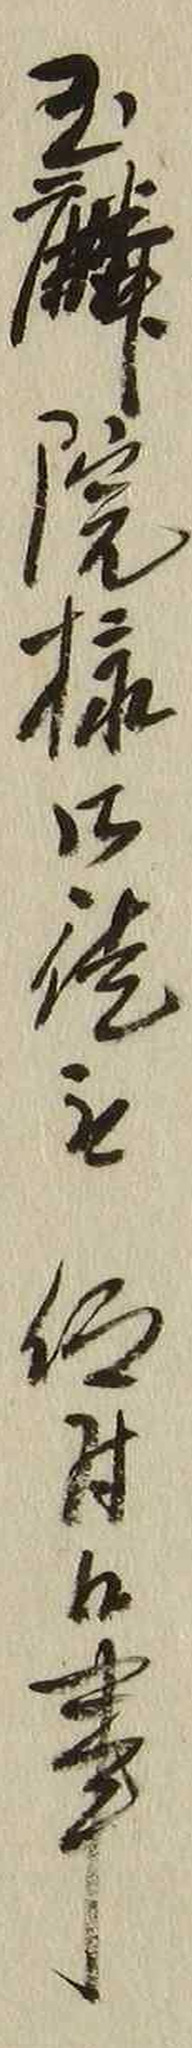玉麟院様御徒被仰付候事
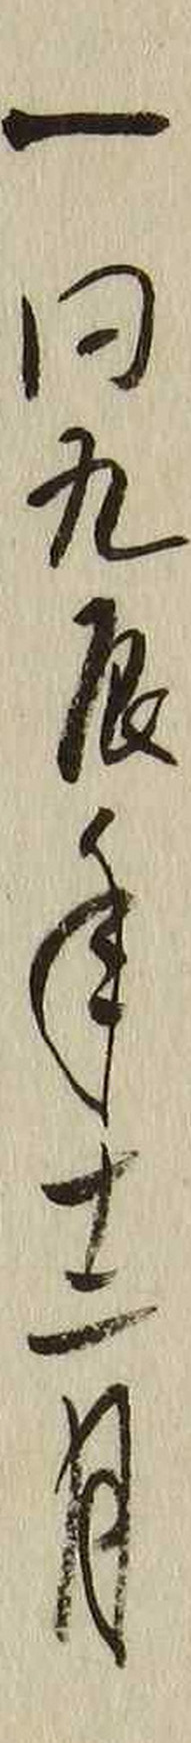一同九辰年十二月
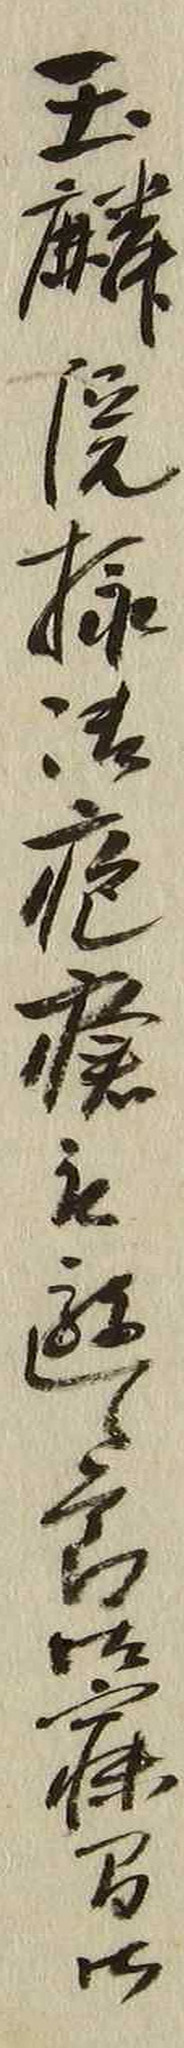玉麟院様御疱瘡被遊候節御寝間御
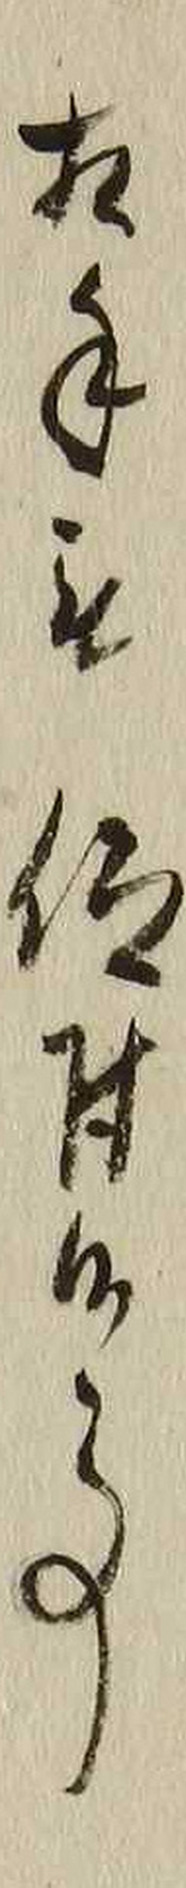相手被仰付候事
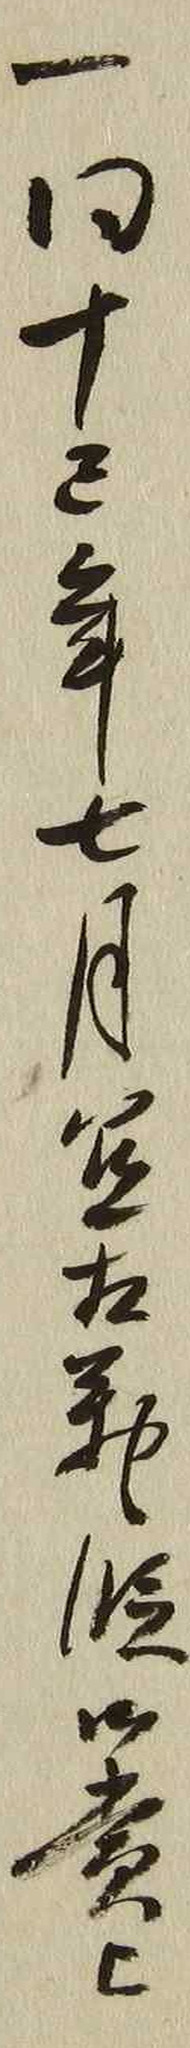一同十巳年七月宜相勤候段御賞ひ
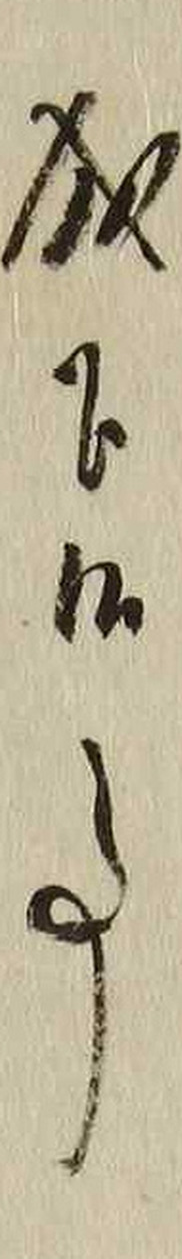成下候事
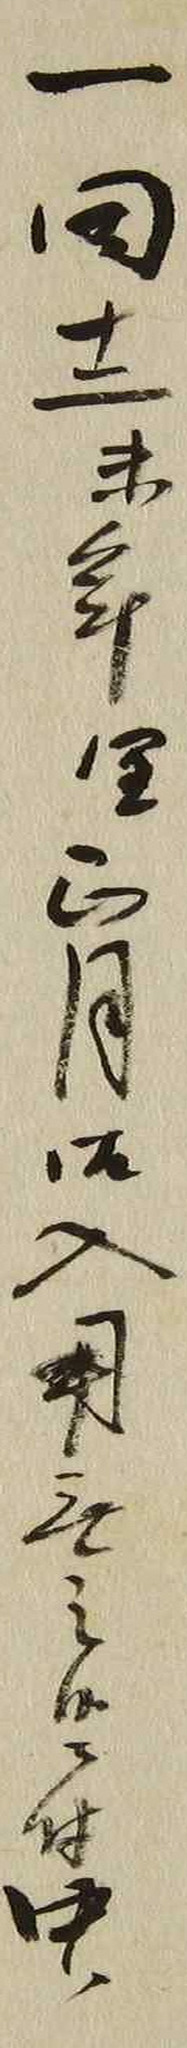一同十二年閏正月御入用無之候に付中ノ
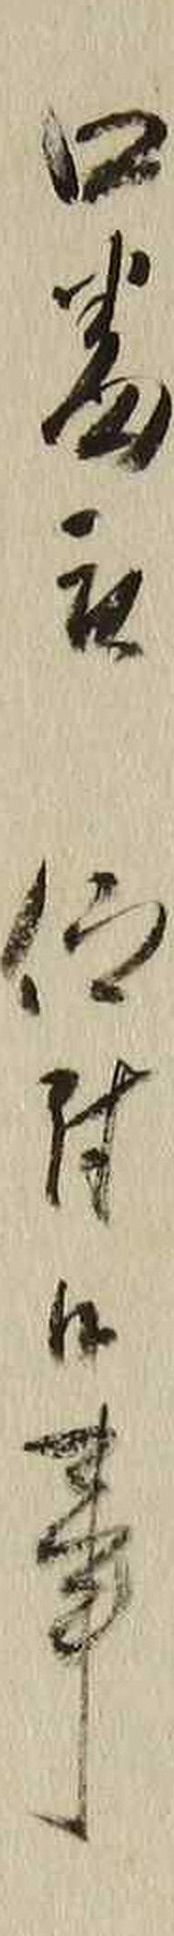口番被仰付候事
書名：諸士系譜　巻之360　す之部10
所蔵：会津若松市立会津図書館
